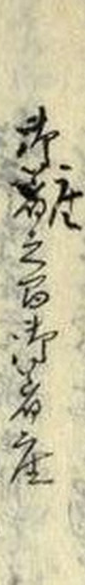御座之間御着座
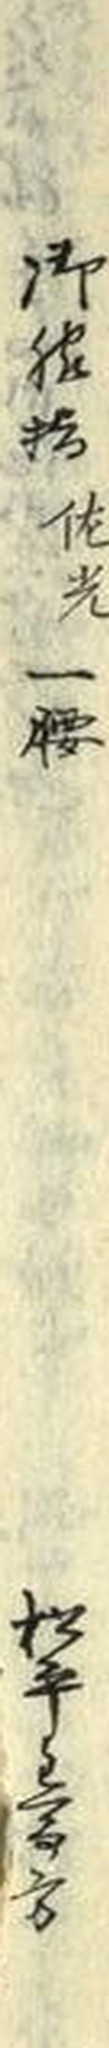御脇指佐光一腰松平主馬方
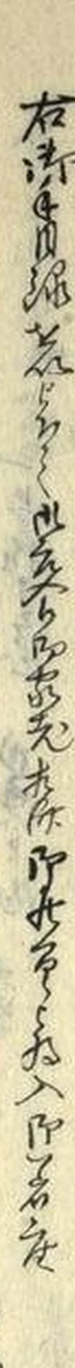右御手目録を以被下之御取合御家老相済御居間へ被為入御着座
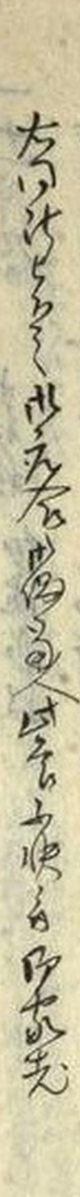右同断被下之御取合御側御用人此節不快ニ付御家老
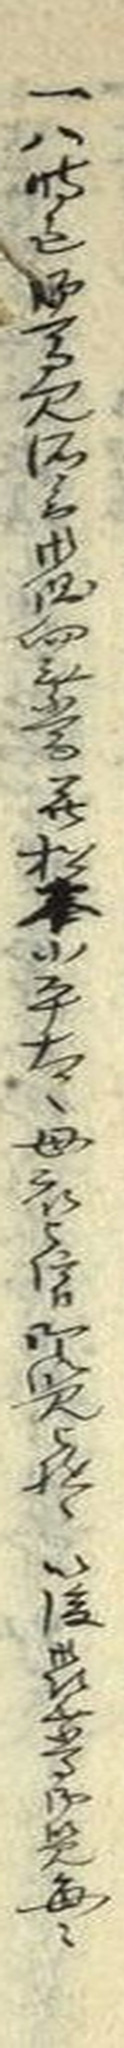一八時過御馬見所ニ而御側向乗馬幷松本小平太へ母衣被仰付御覧被遊候以後御次乗馬御覧毎々
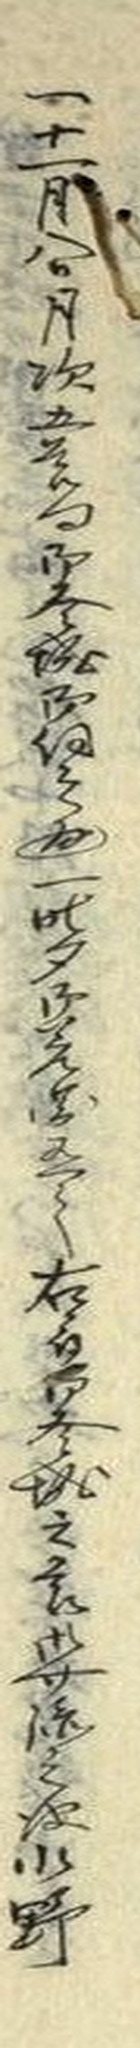一十一月八日月次五節句御登城御伺之通一昨夕御差図有之右ニ付御登城之節御介添之儀水野

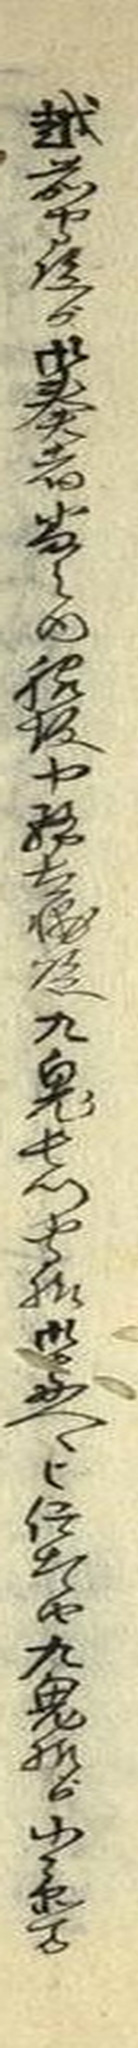越前守殿ゟ御奏者番之内脇坂中務大輔殿九鬼長門守様御両人へ被仰出候由九鬼様ゟ小兵衛方
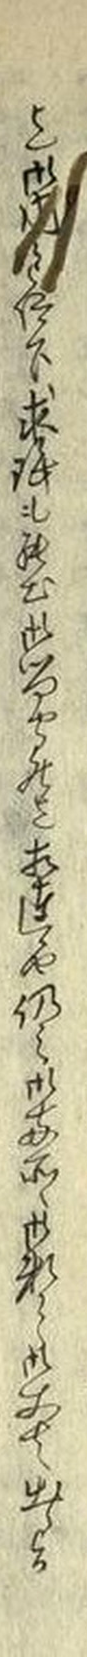迄御内々被仰下候求珉も罷出御留守居迄相達候由依之御両所へ御頼之御使者出候旨
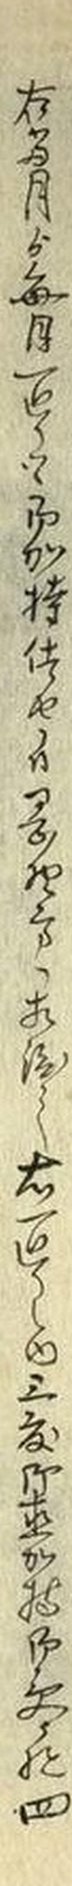右当月ゟ毎月一廻りツヽ御加持仕候由ニ付岡野方へ相渡之右一廻り之内三度御直加持御受被遊四
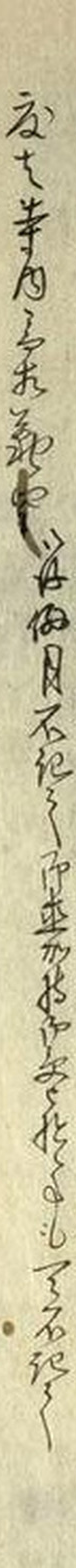度者寺内ニ而相勤候由以後例月不記之御直加持御受被遊候事も一々不記之
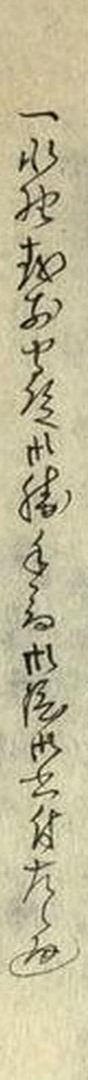一水野越前守殿御勝手ニ而御渡御書付左之通
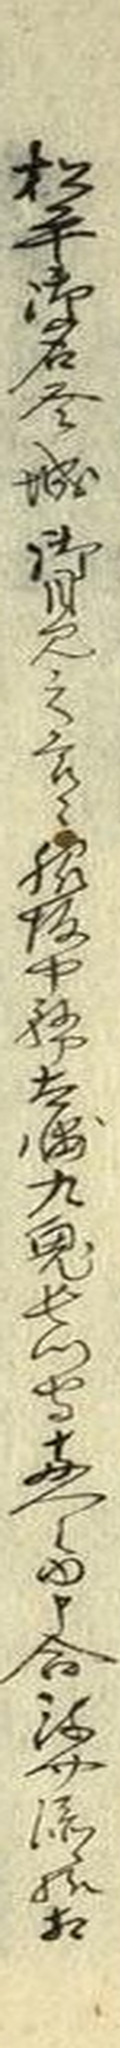松平御名登城御目見之節々脇坂中務大輔九鬼長門守両人之内申合致介添候様相
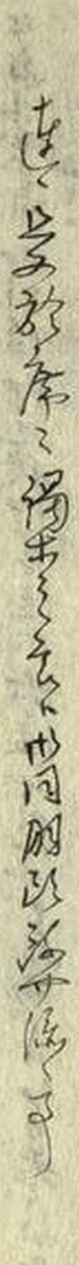達候且又於席々謁等之節ハ御同朋頭致介添候事
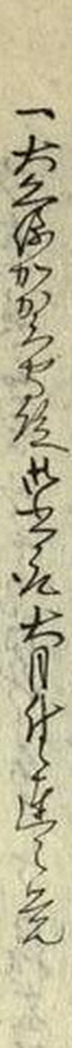一大久保加賀守殿御書取大目付へ達之覚
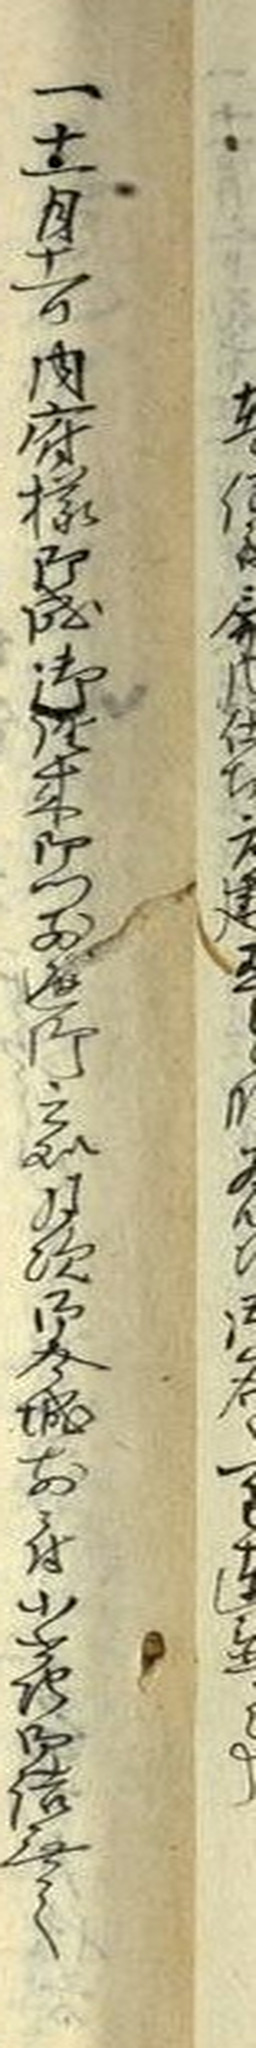一十一月十一日内府様御成御往来御門前通行之処月次御登城前ニ付小書院御詰無之
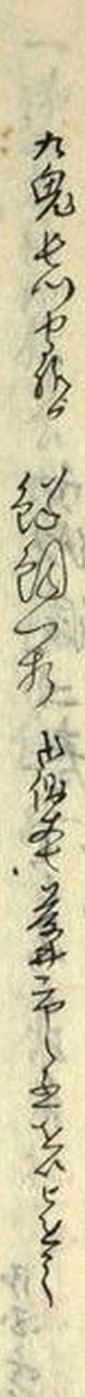九鬼長門守様ゟ鮮鯛一折御側使者藤井市之丞を以被進之
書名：少傅日録抄（斉善付側向頭取日記、在府）
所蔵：福井県文書館 Fukui Prefectural Archives
